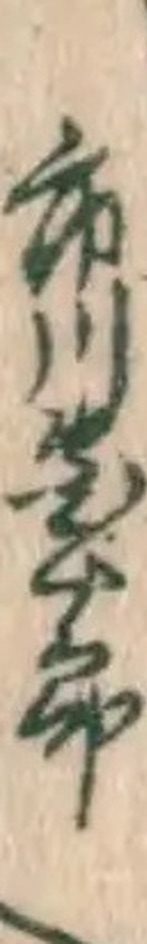市川団十郎
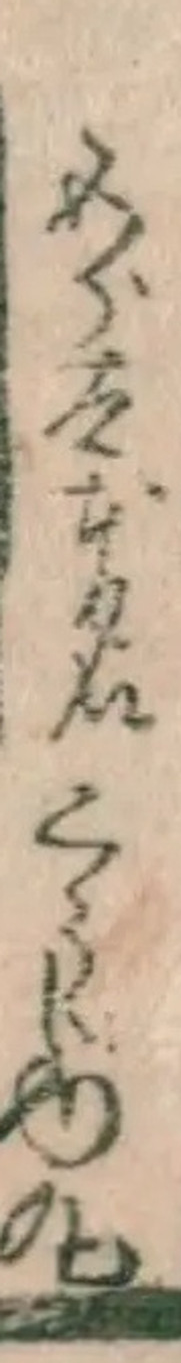五郎太本名くうしゆ丸
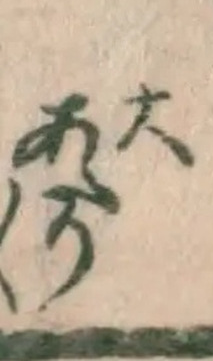あたり
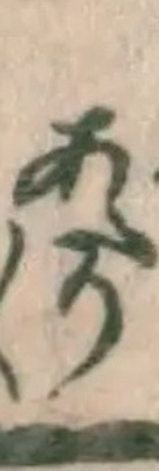あたり
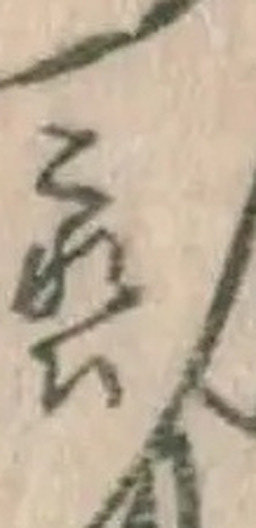これは
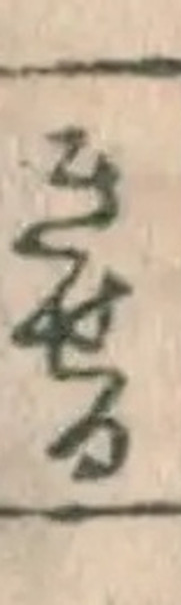きせる
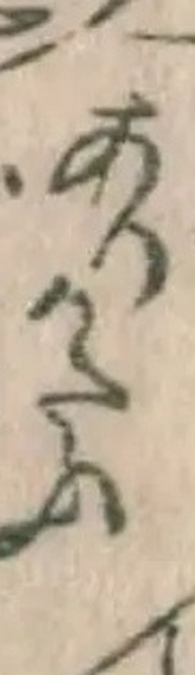ありかたふ
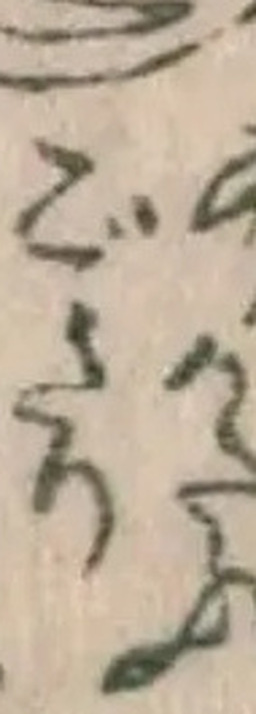ござり
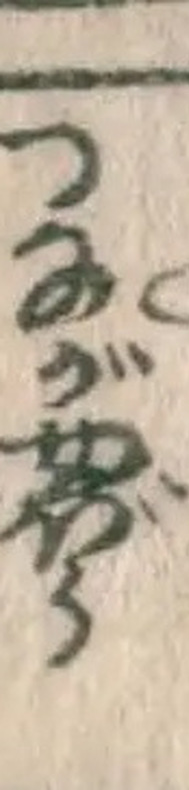つなが女ぼう
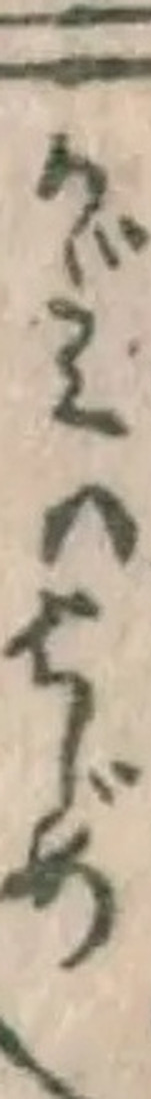かゞみははじめて
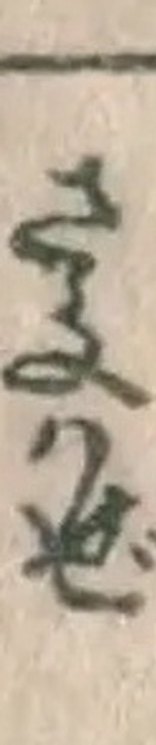さよかぜ
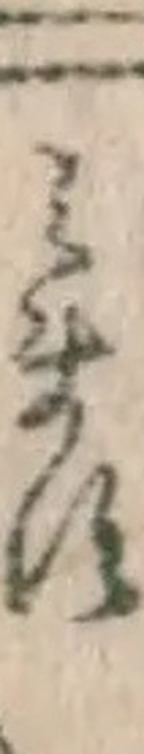みます
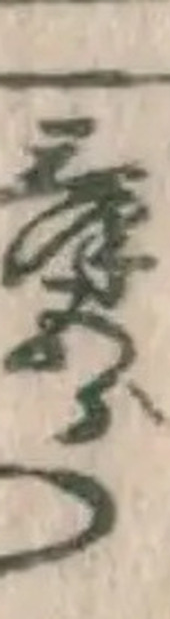三津五郎
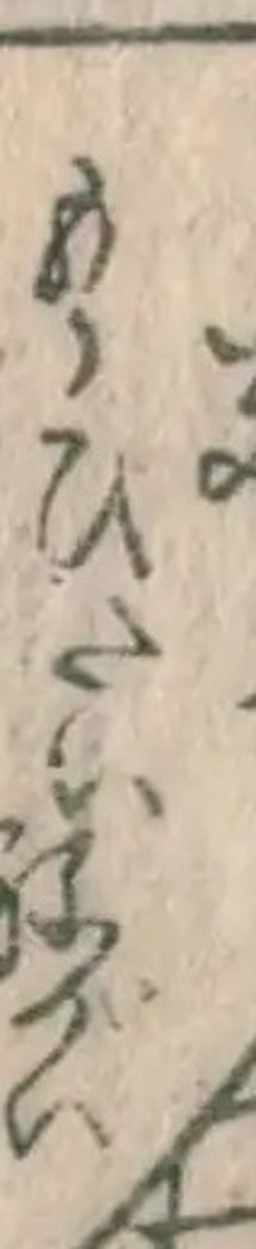もらひたいねがい
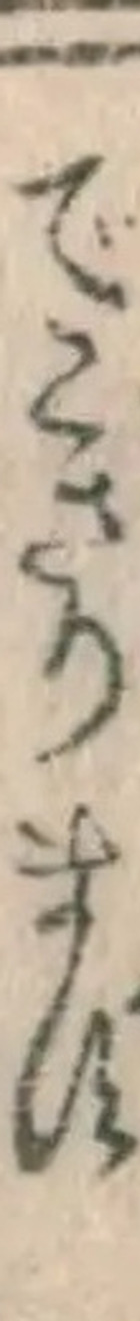でござります
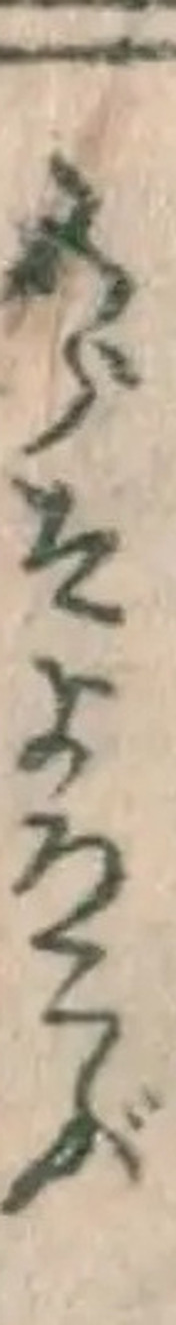五郎太よろこぶ
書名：菊慈童酒宴岩窟
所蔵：国立国会図書館 National Diet Library, JAPAN
